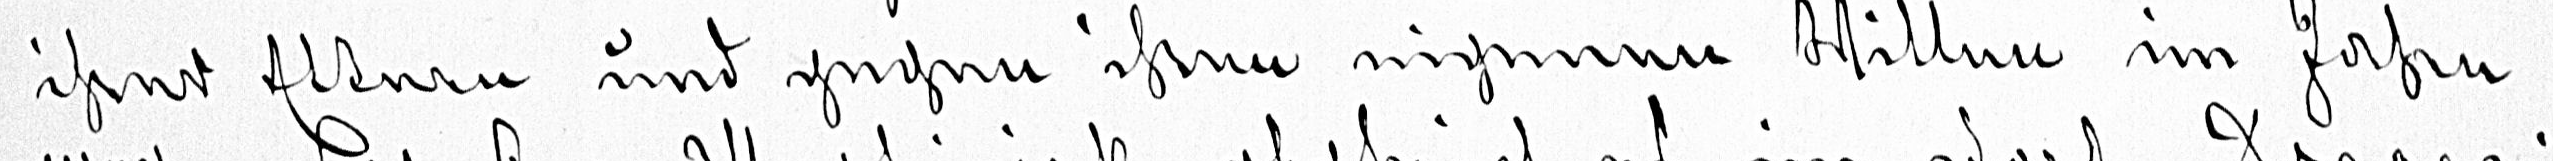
ihrer Eltern und gegen ihren eigenen Willen im Jahre
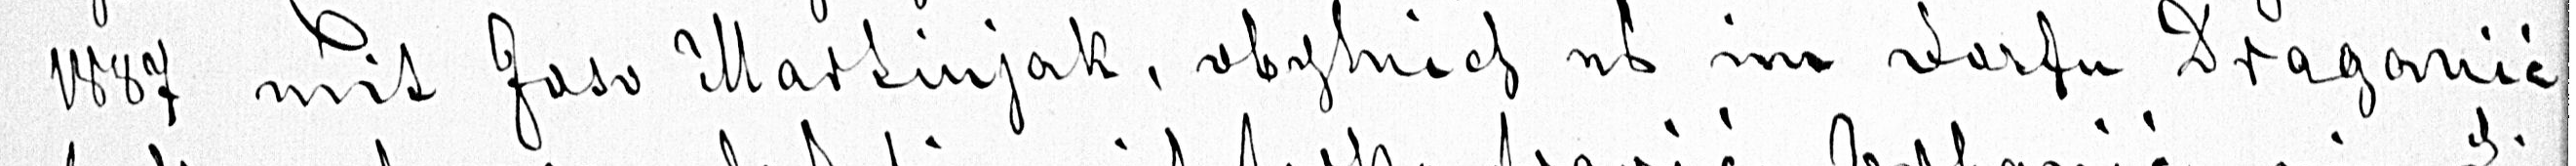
1887 mit Joso Martinjak, obgleich es im Dorfe Draganić
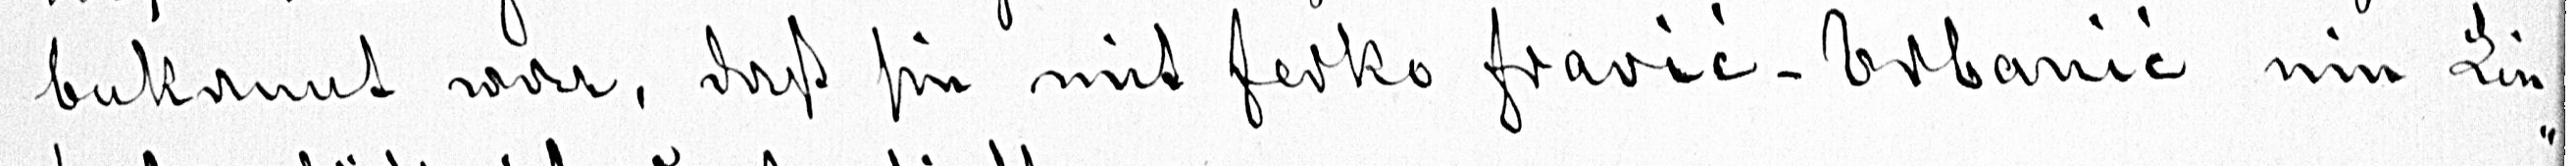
bekannt war, daß sie mit Ferko Fravić-Vrbanić ein Lie¬
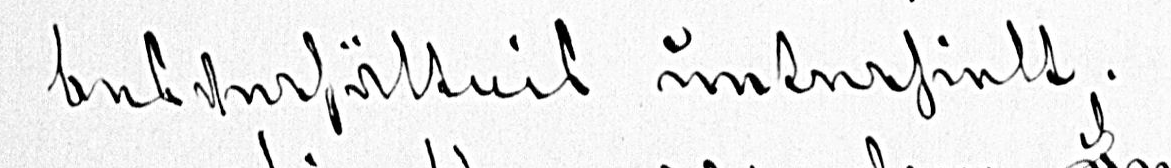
besverhältnis unterhielt.
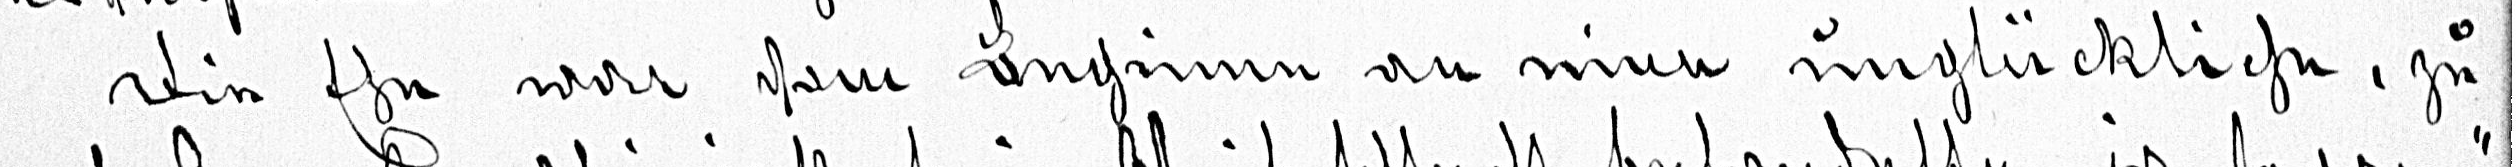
Die Ehe war vom Beginne an eine unglückliche, zu¬
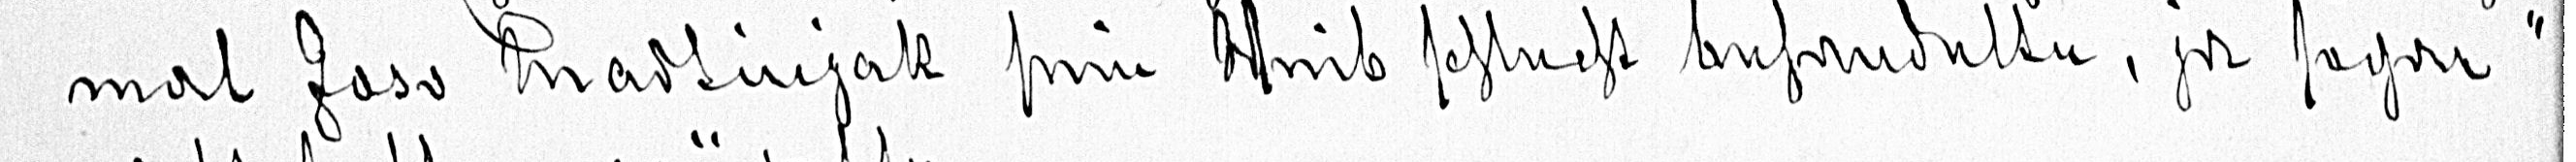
mal Joso Martinjak sein Weib schlecht behandelte, ja sogar
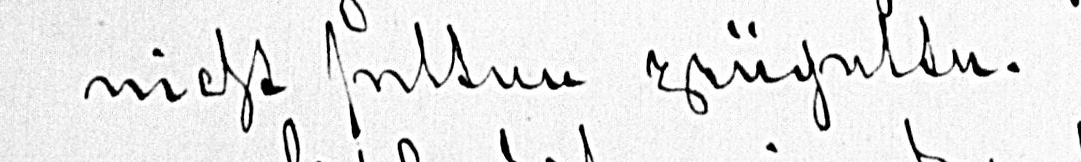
nicht selten prügelte.
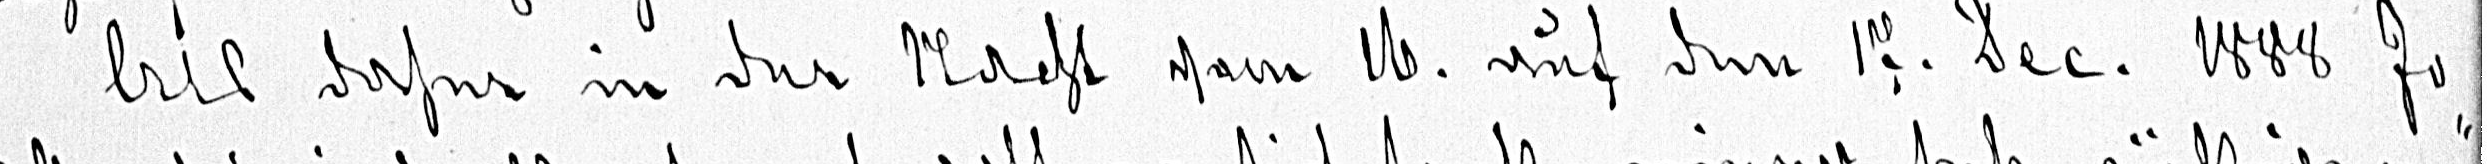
Als daher in der Nacht vom 16. auf den 17. Dec. 1888 Jo¬
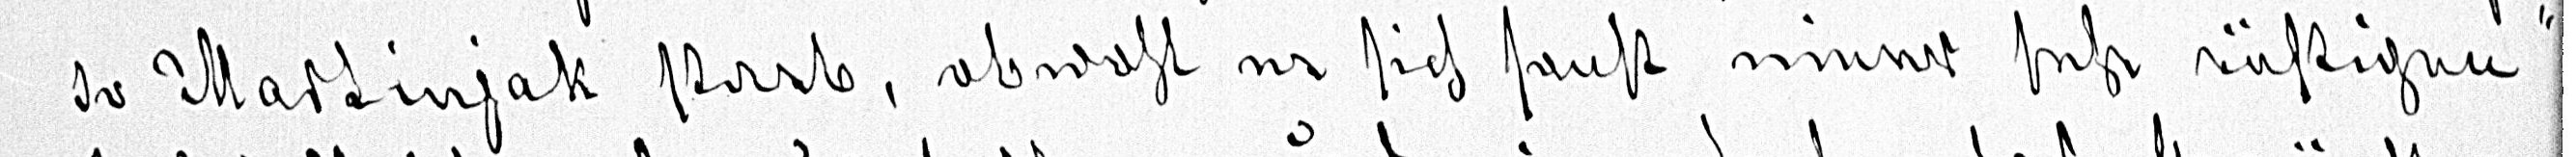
so Martinjak starb, obwohl er sich sonst einer sehr rüstigen
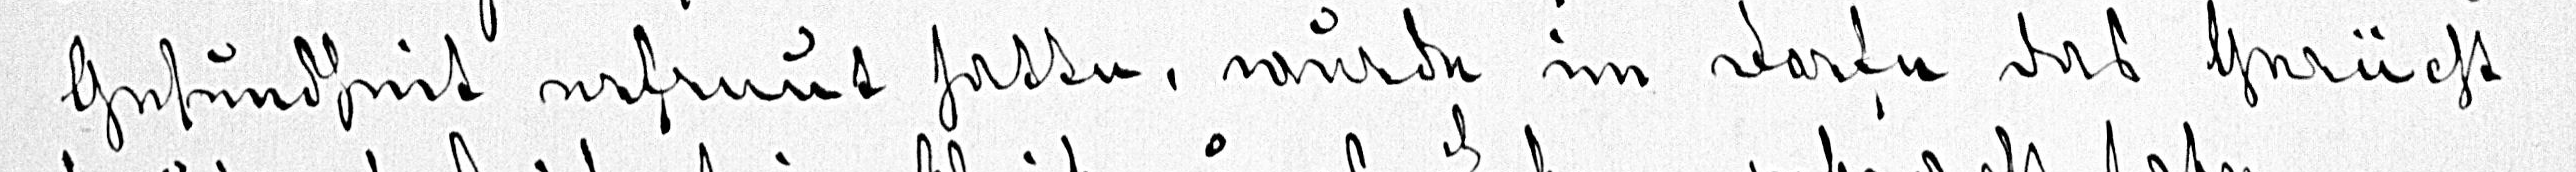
Gesundheit erfreut hatte, wurde im Dorfe das Gerücht
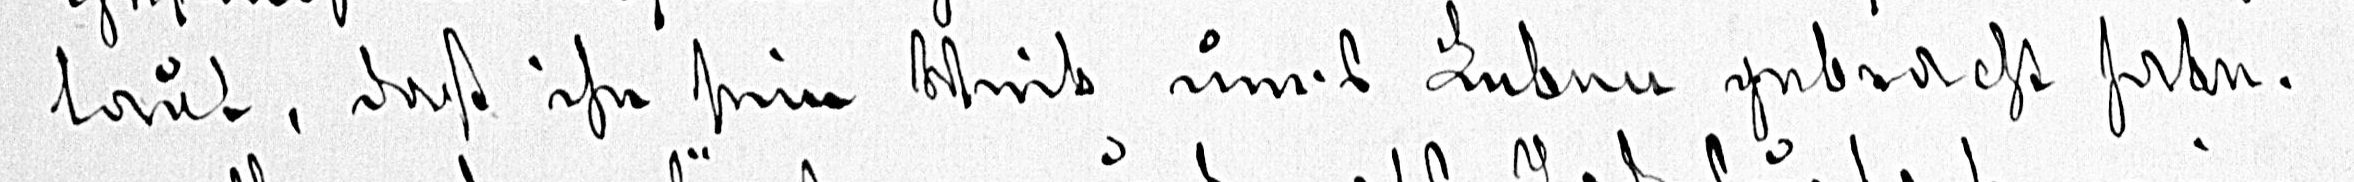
laut, daß ihn sein Weib um's Leben gebracht habe.
